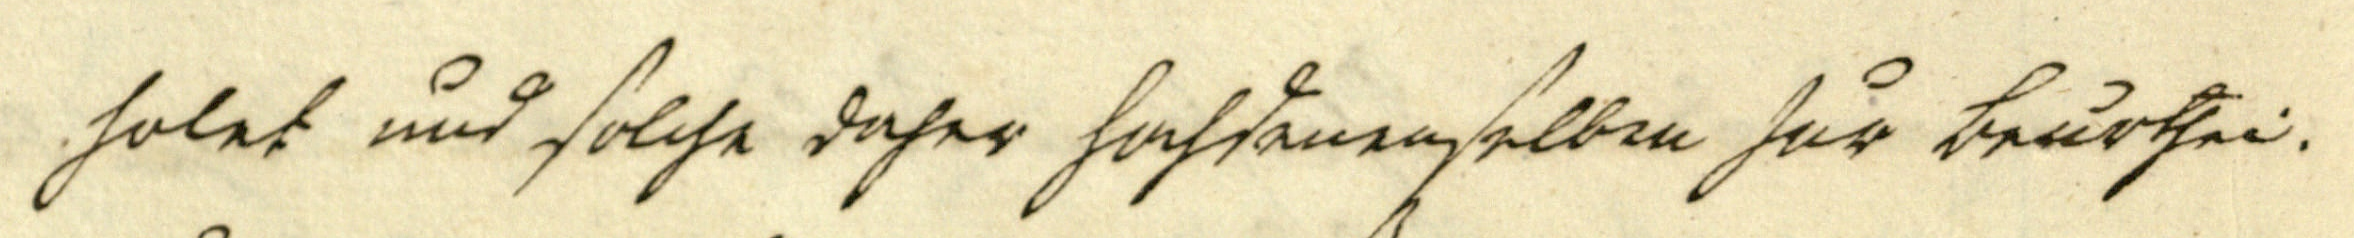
holet und solche daher Hochdenenselben zur Beurthei¬
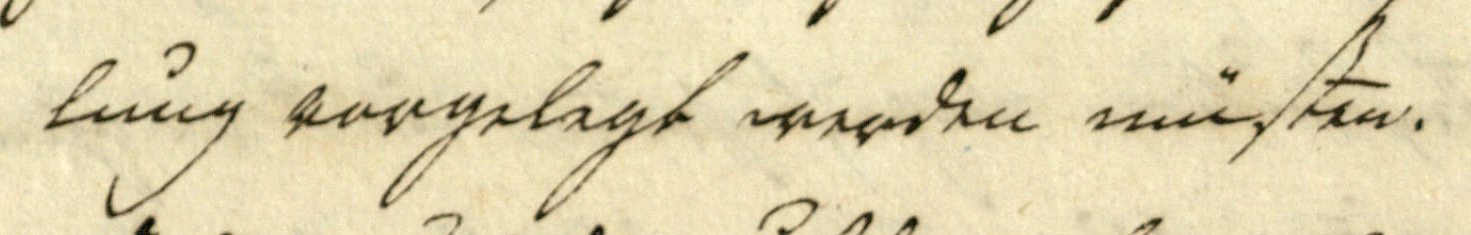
lung vorgelegt werden müßten:
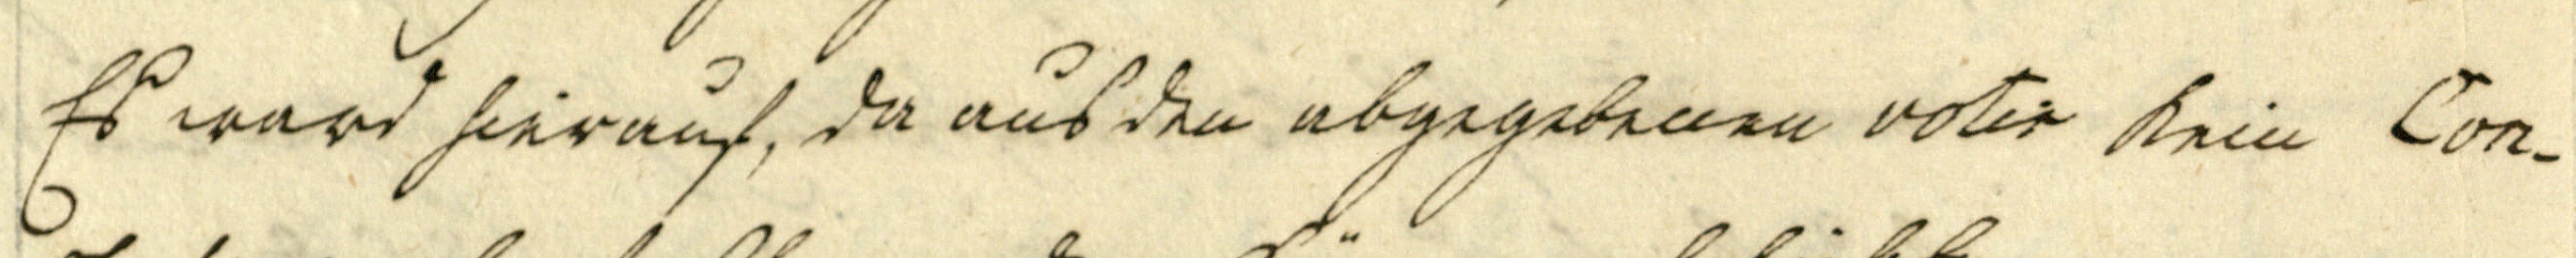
Es ward hierauf, da aus den abgegebenen votis kein Con¬
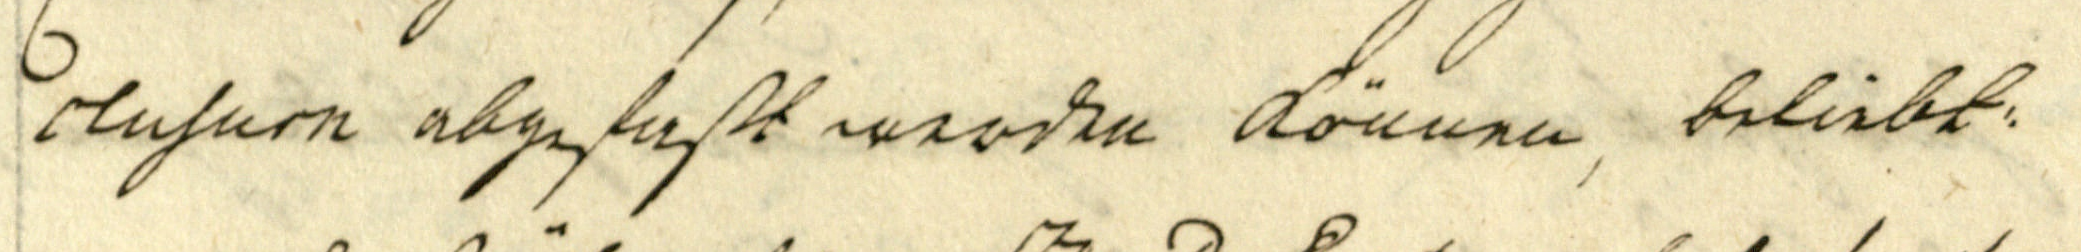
clusum abgefaßt werden können, beliebt:
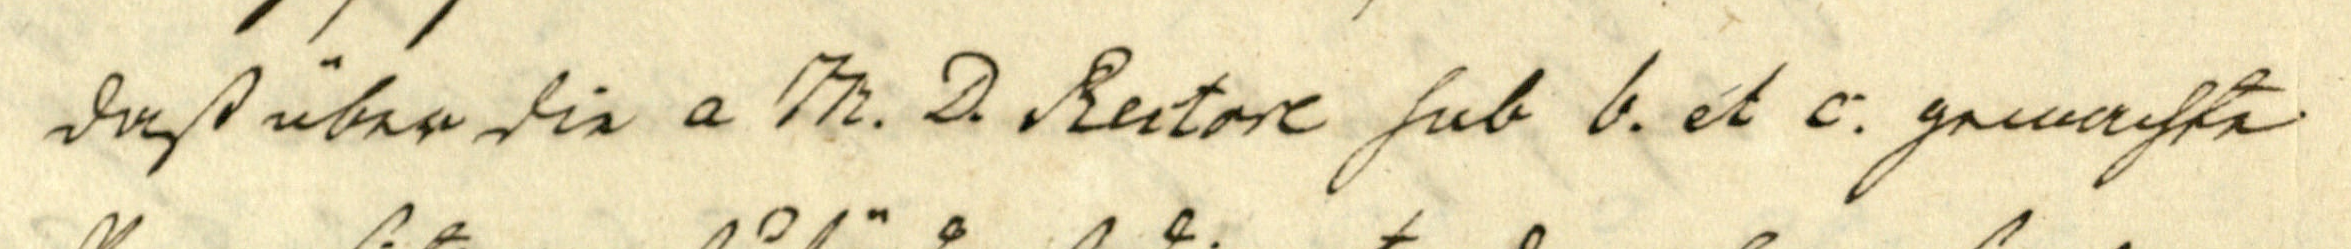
daß über die a M. D. Rectore sub b. et c. gemachte
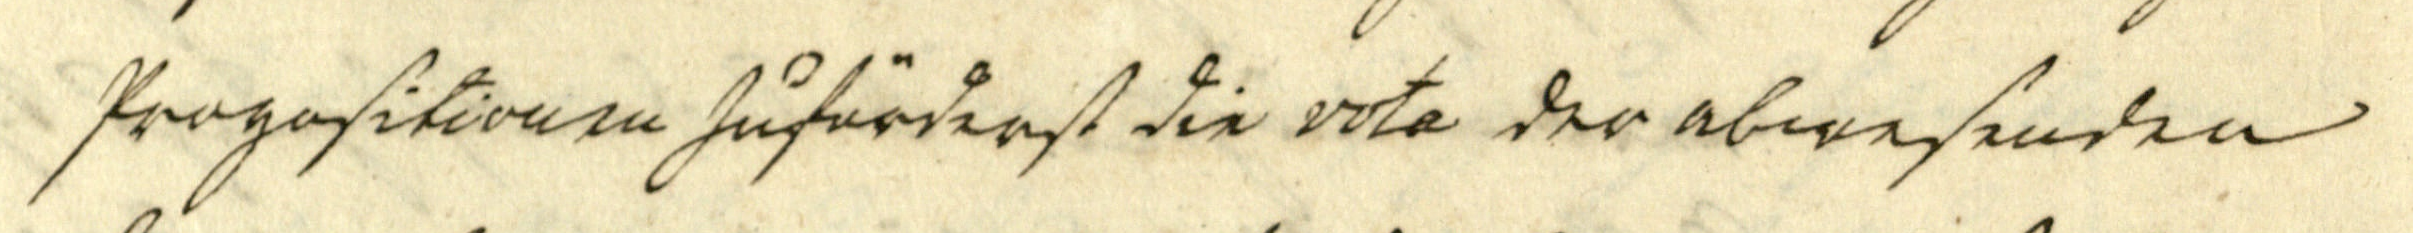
Propositionen zuförderst die vota der abwesenden
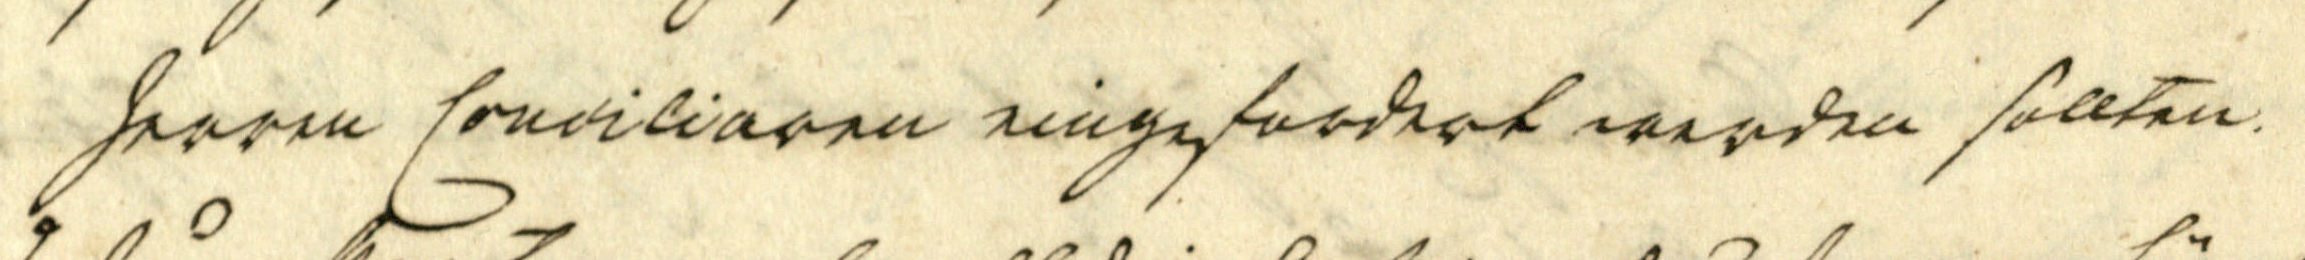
Herren Conciliaren eingefordert werden sollten.
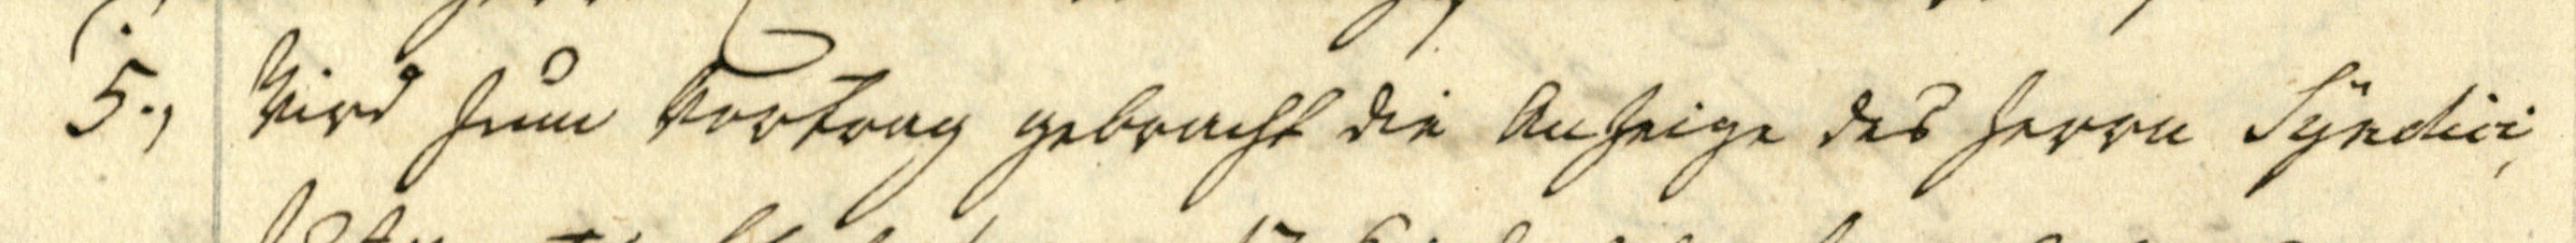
5., Wird zum Vortrag gebracht die Anzeige des Herrn Sÿndici,
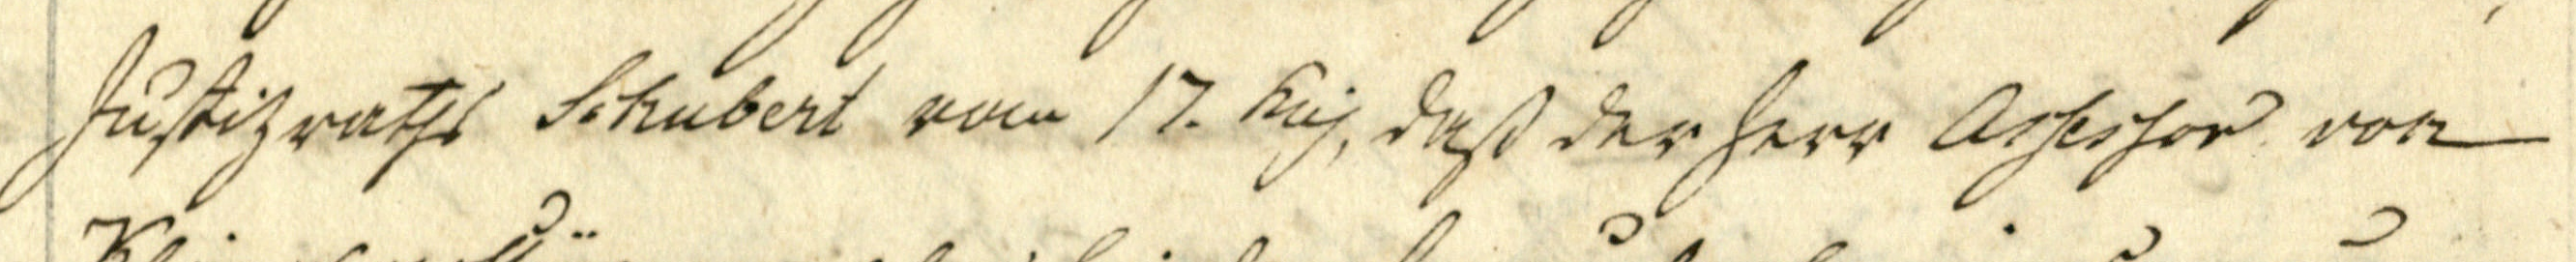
Justizraths Schubert vom 17. huj, daß der Herr Assessor von
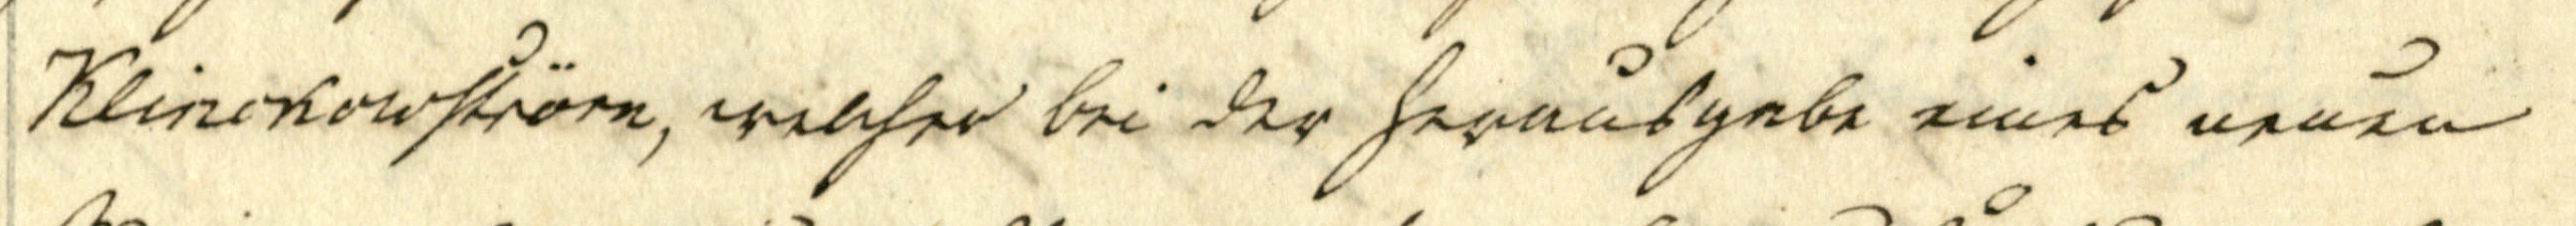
Klinckowström, welcher bei der Herausgabe eines neuen
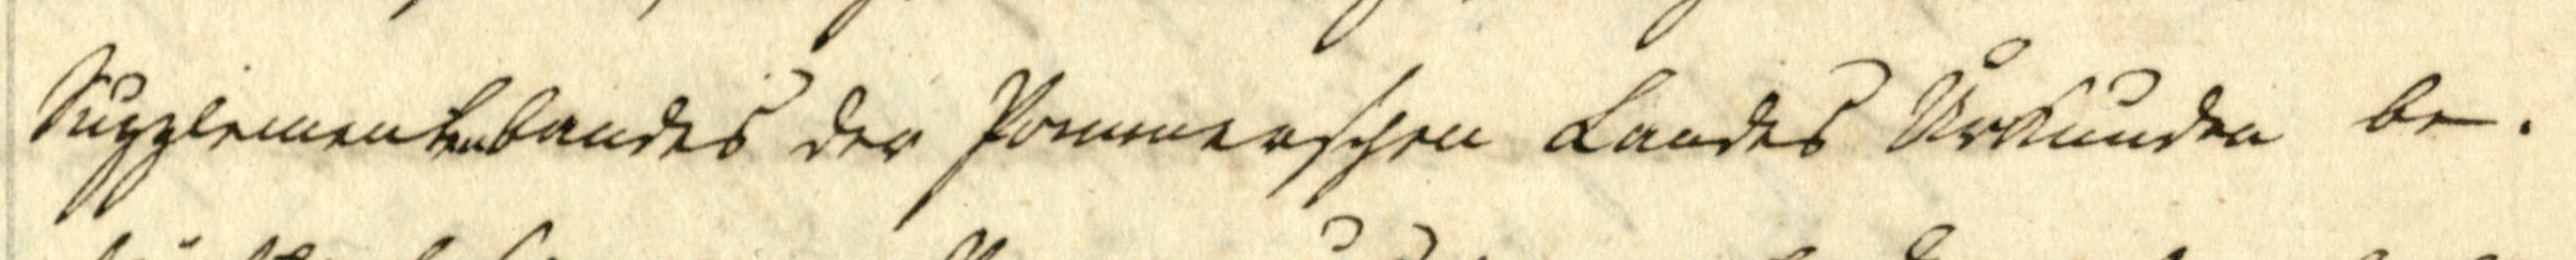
Supplementenbandes der Pommerschen Landes Urkunden be¬
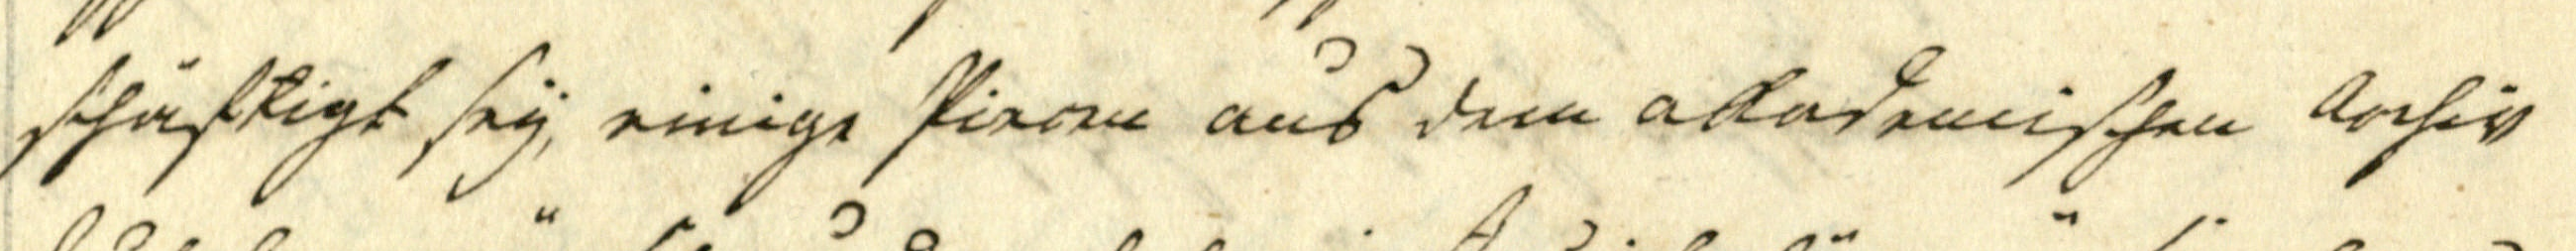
schäftigt seÿ, einige Piecen aus dem akademischen Archiv
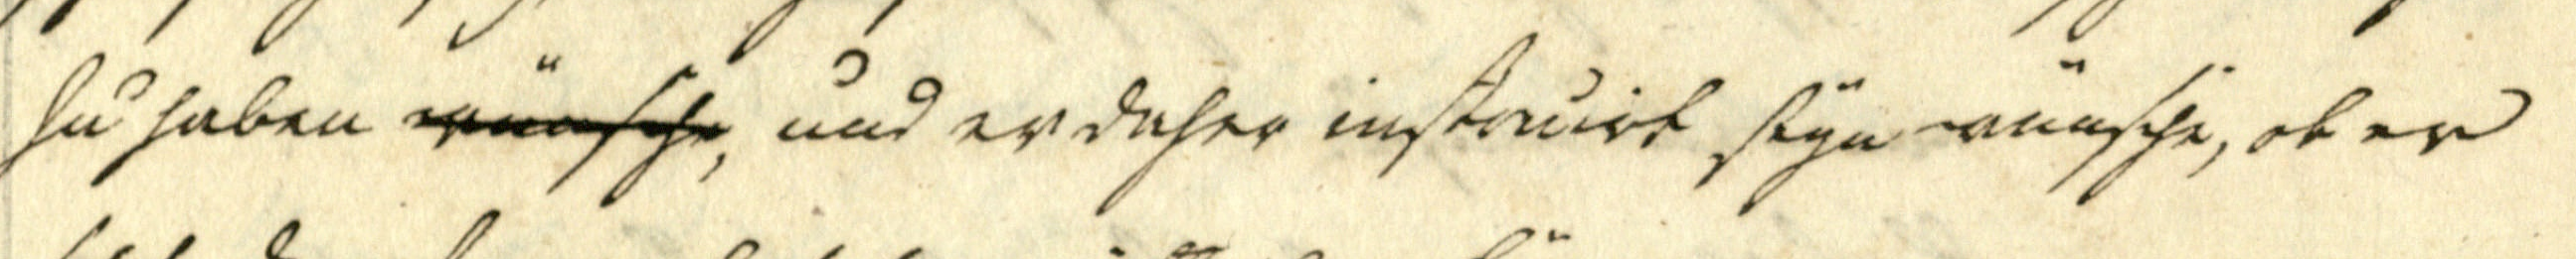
zu haben wünsche, und er daher instruirt seÿn wünsche, ob er
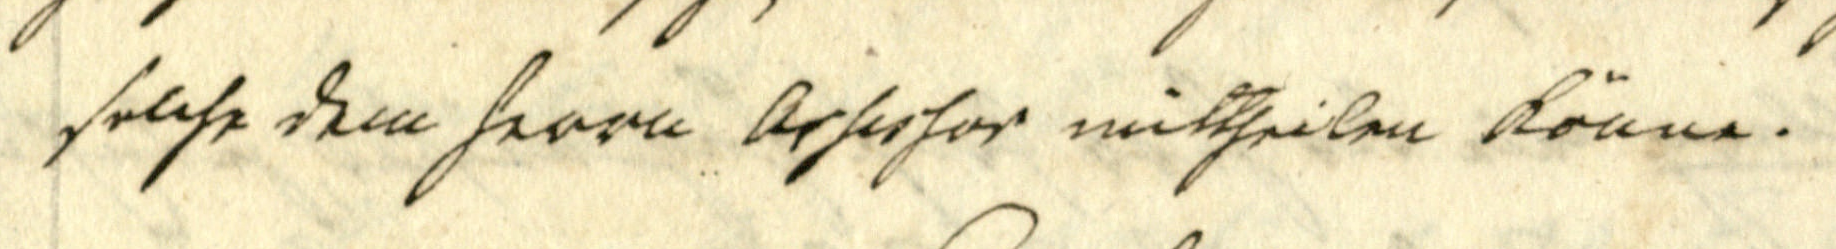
solche dem Herrn Assessor mittheilen könne.
